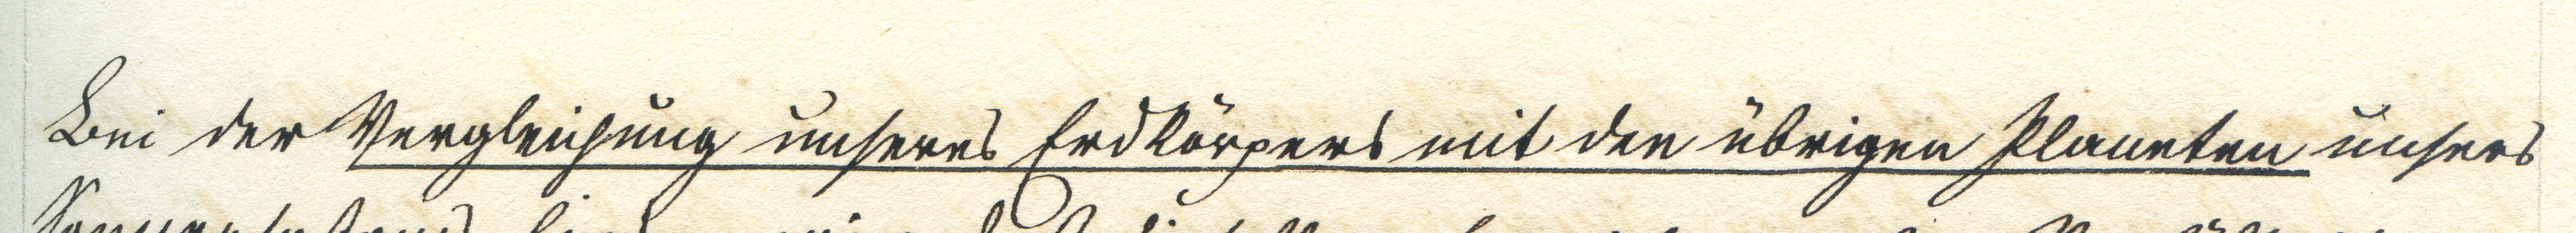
Bei der Vergleichung unseres Erdkörpers mit den übrigen Planeten unsers
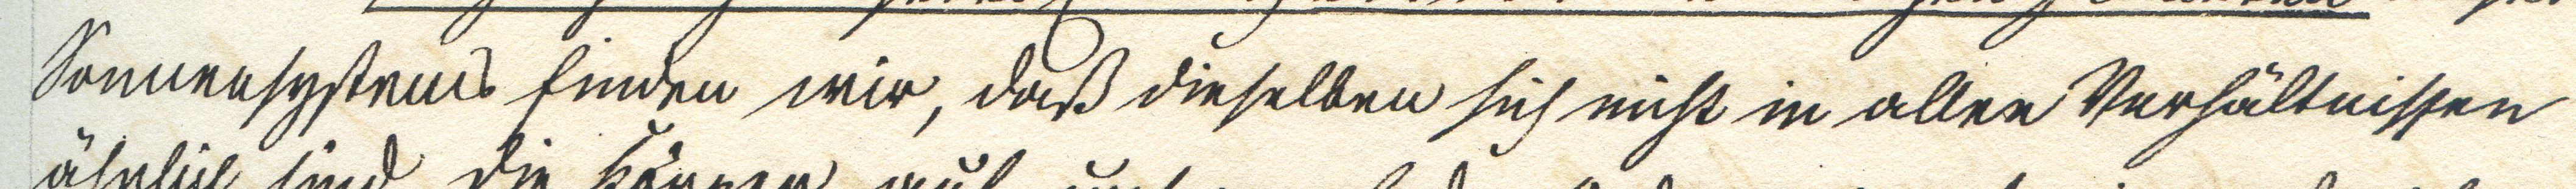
Sonnensystems finden wir, daß dieselben sich nicht in allen Verhältnissen
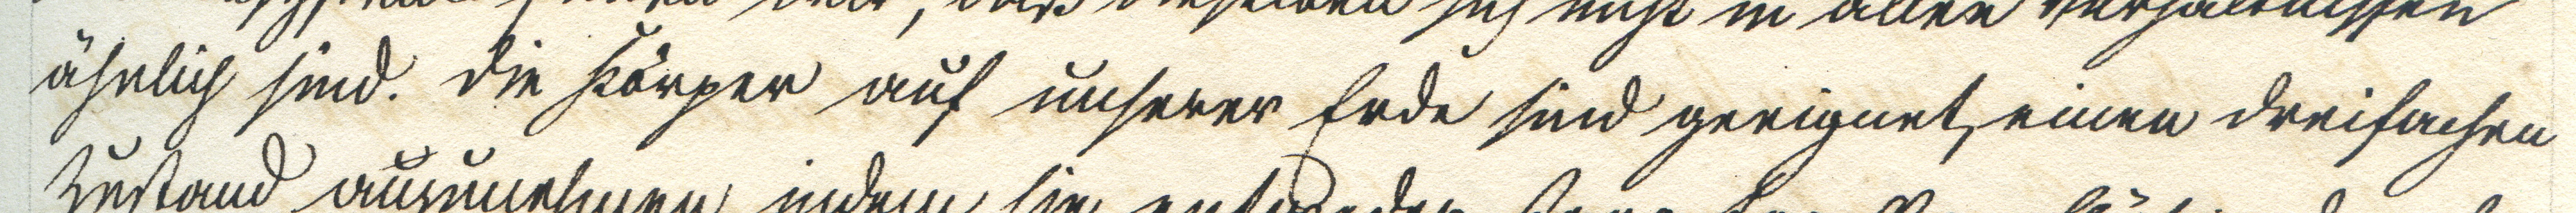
ähnlich sind. Die Körper auf unserer Erde sind geeignet, einen dreifachen
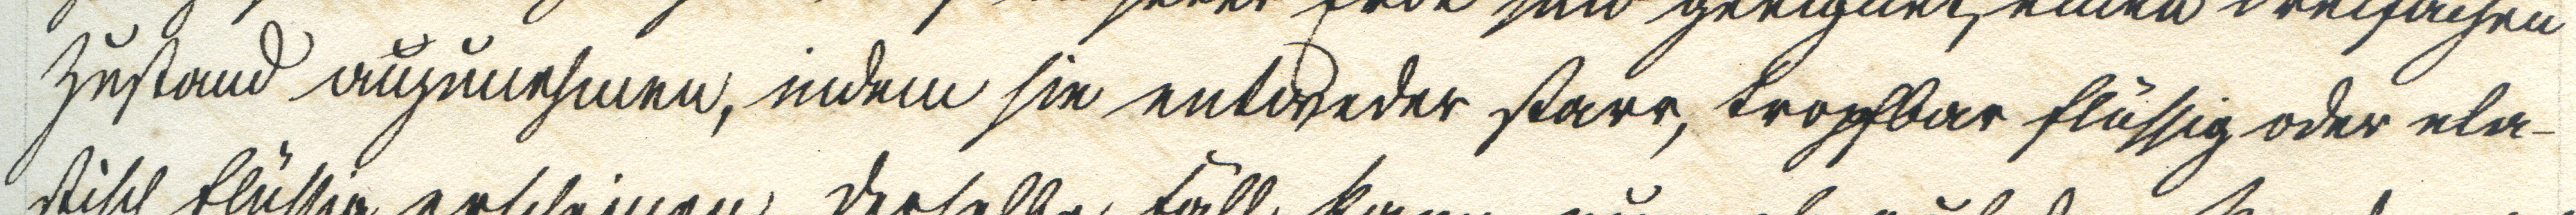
Zustand a￼nzunehmen, indem sie entweder starr, tropfbar flüssig oder ela-
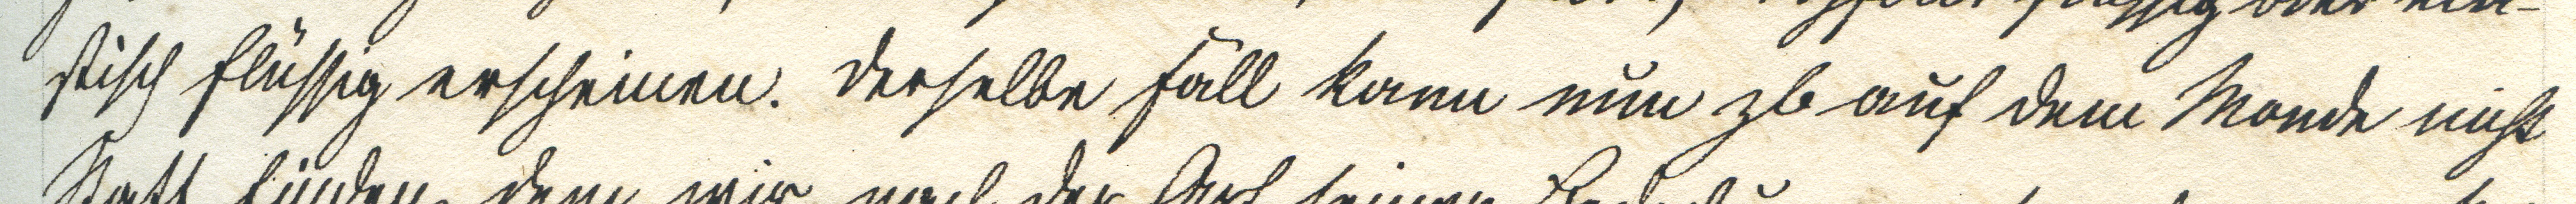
stisch flüssig erscheinen. Derselbe Fall kann nun zb auf dem Monde nicht
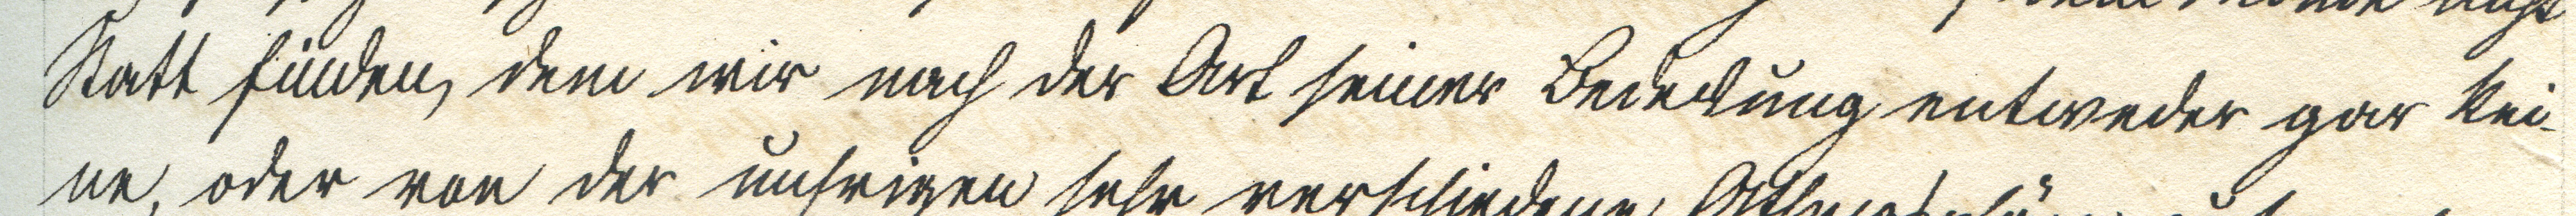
statt finden, dem wir nach der Art seiner Bedeckung entweder gar kei-
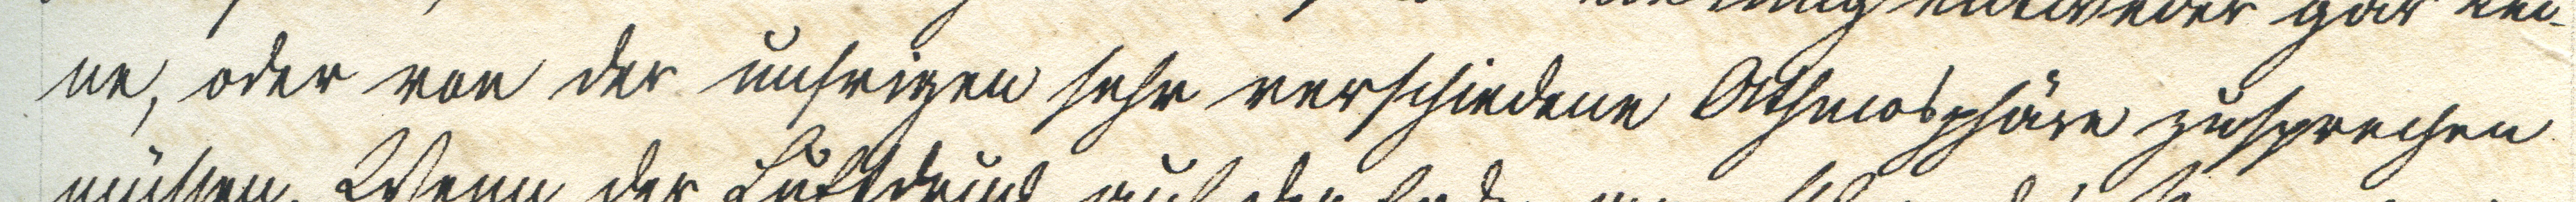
ne, oder von der unsrigen sehr verschiedene Athmosphäre zusprechen
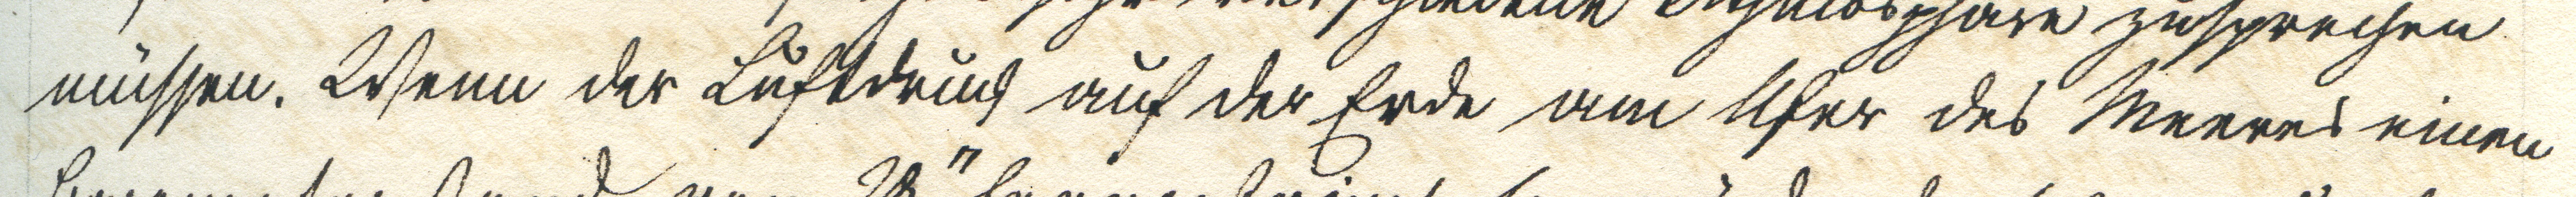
müssen. Wenn der Luftdruck auf der Erde am Ufer des Meeres einen
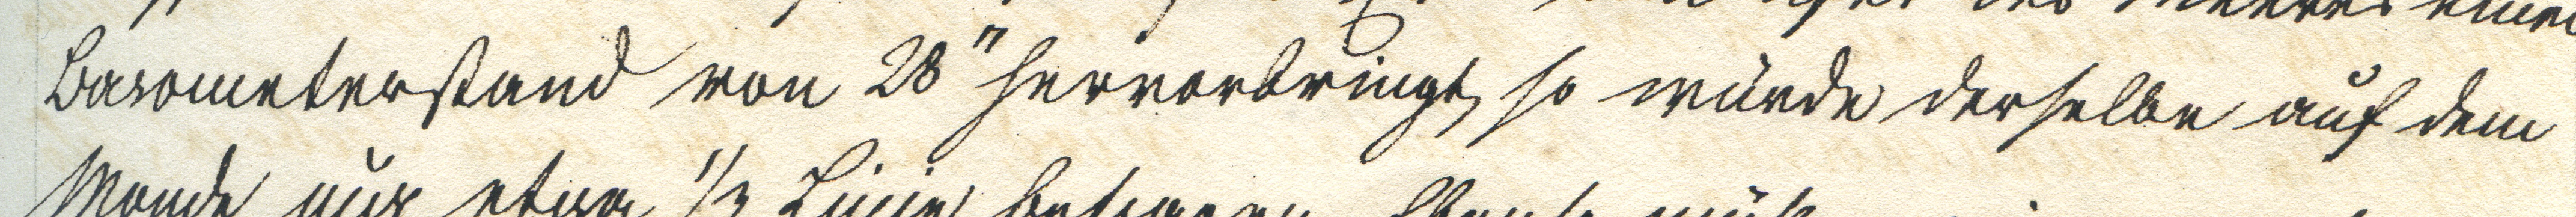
Barometerstand von 28" hervorbringt, so würde derselbe auf dem
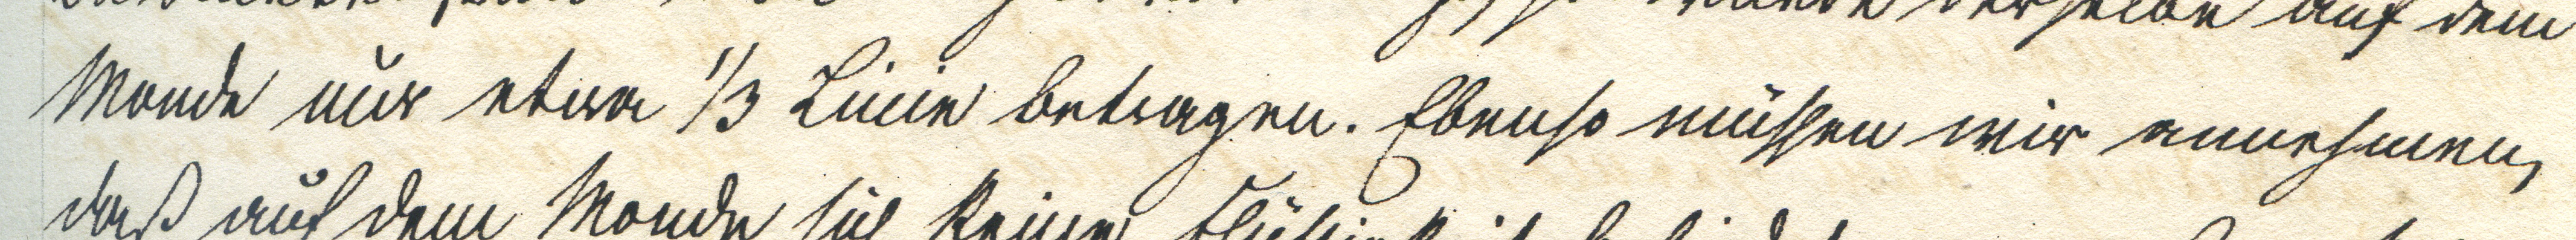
Monde nur etwa ⅓ Linie betragen. Ebenso müssen wir annehmen,
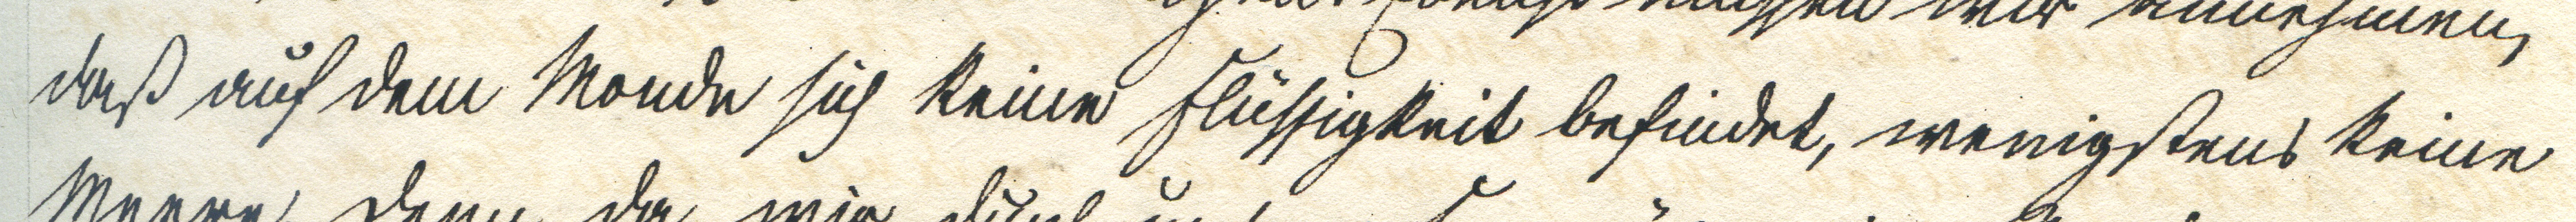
daß auf dem Monde sich keine Flüssigkeit befindet, wenigstens keine
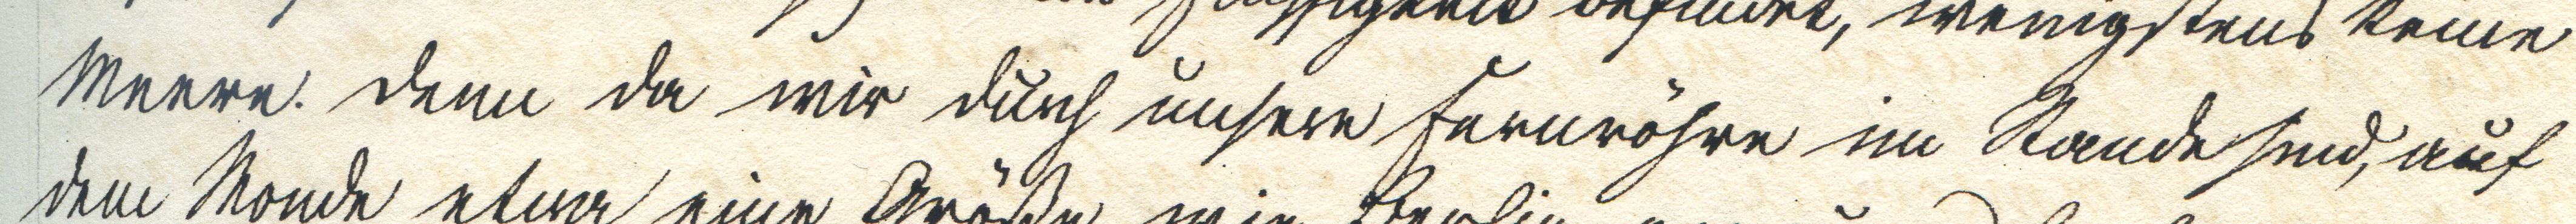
Meere. Denn da wir durch unsere Fernröhre im Stande sind, auf
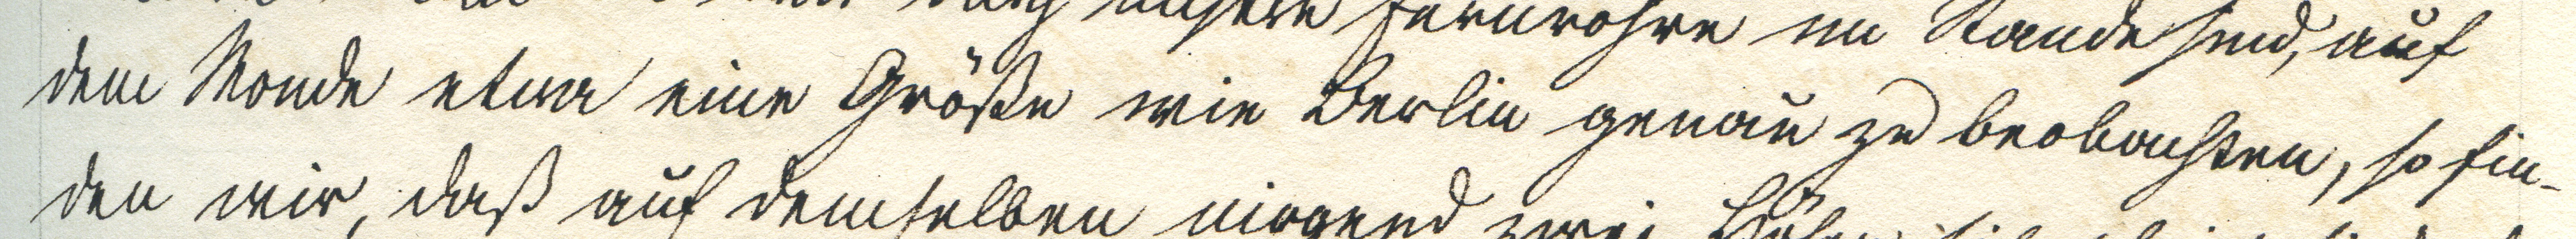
dem Monde etwa eine Größe wie Berlin genau zu beobachten, so fin-
